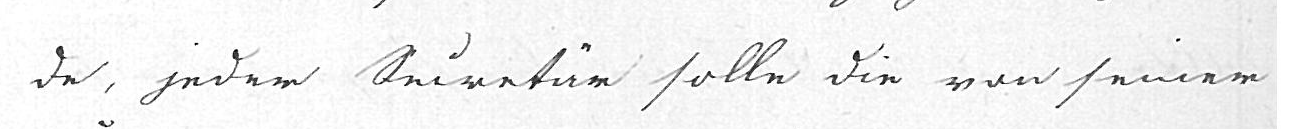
de, jeder Secretär solle die von seiner
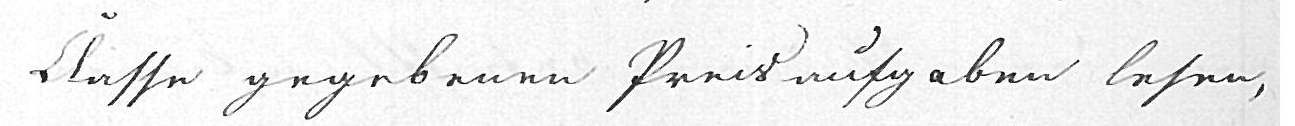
Classe gegebenen Preisaufgaben lesen,
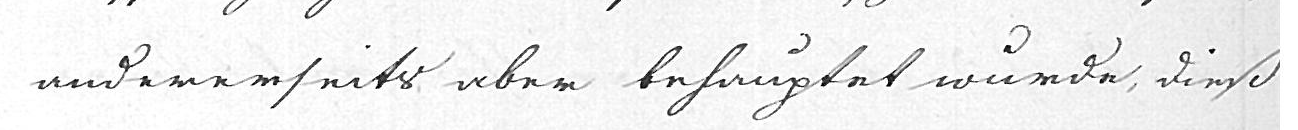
andererseits aber behauptet wurde, dieß
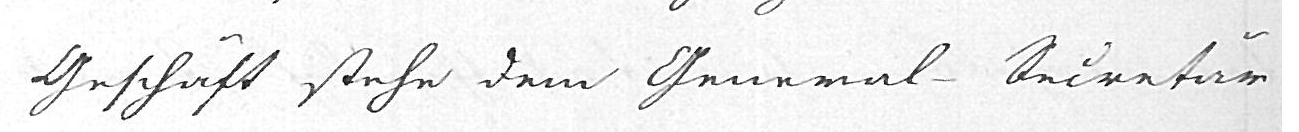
Geschäft stehe dem General-Secretär
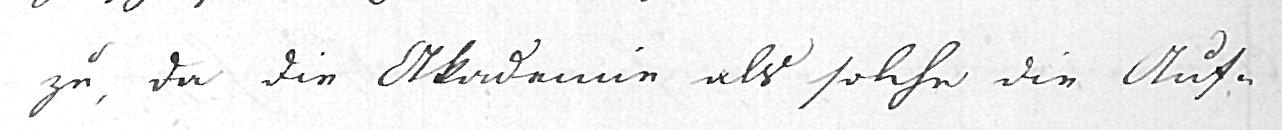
zu, da die Akademie als solche die Auf-
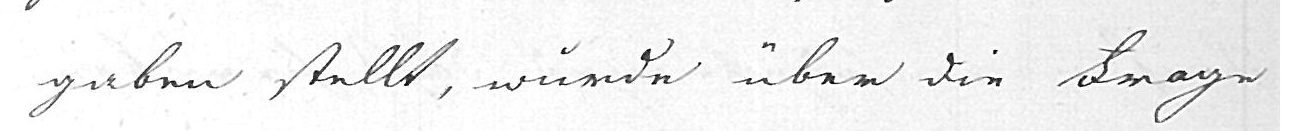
gaben stellt, wurde ber die Frage
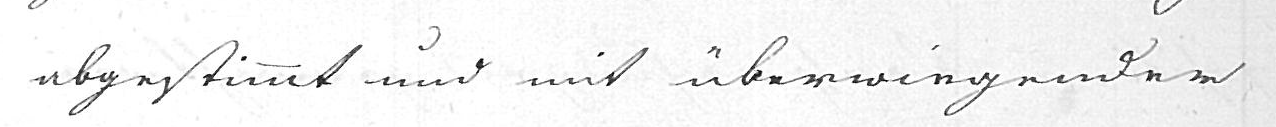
abgestimmt und mit überwiegender
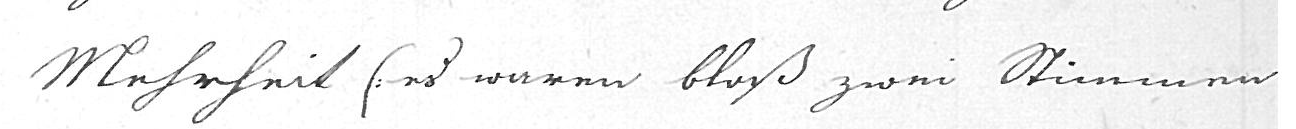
Mehrheit (es waren bloß zwei Stimmen
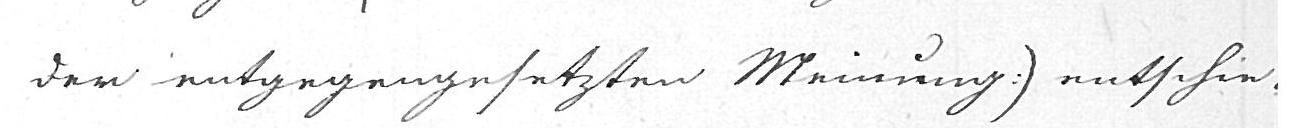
der entgegengesetzten Meinung) entschie-
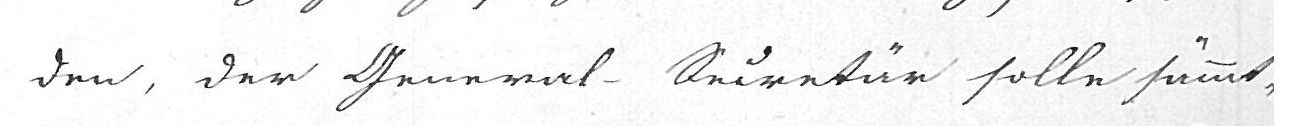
den, der General-Secretär solle sämmt-
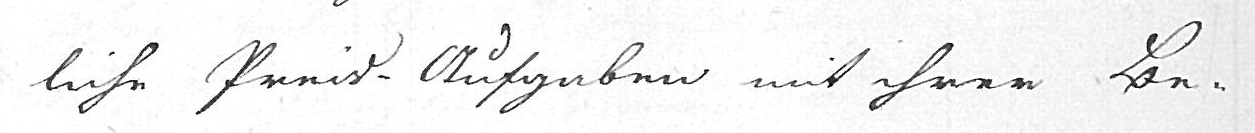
liche Preis-Aufgaen mit ihrer Be-
